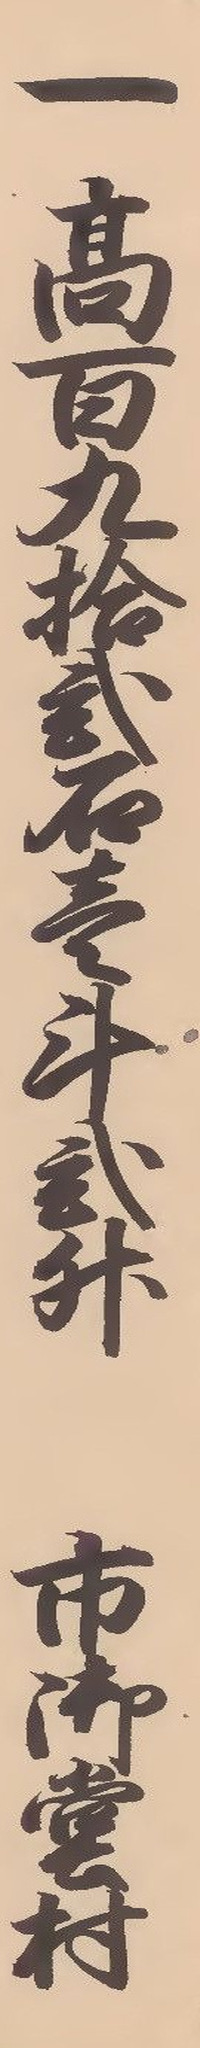一高百九拾弐石壱斗弐升市御堂村
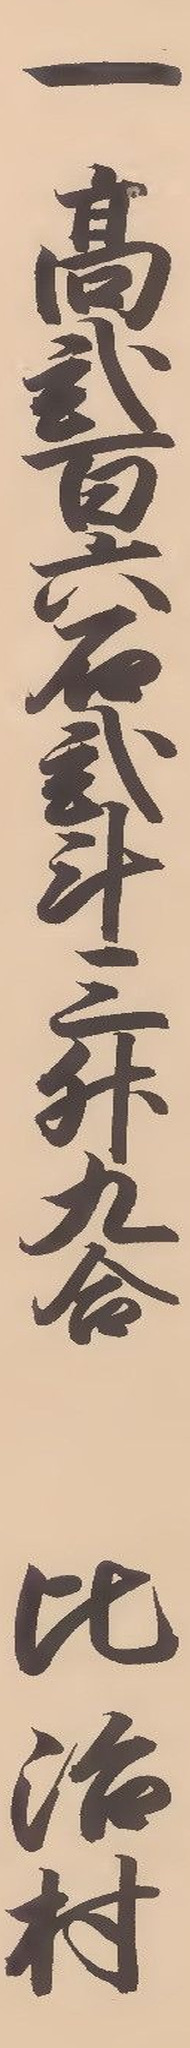一高弐百六石弐斗三升九合比治村
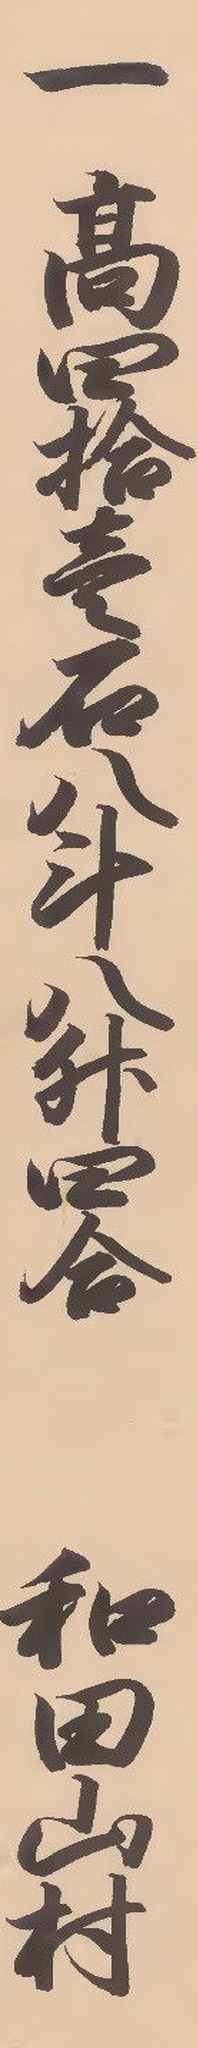一高四拾壱石八斗八升四合和田山村
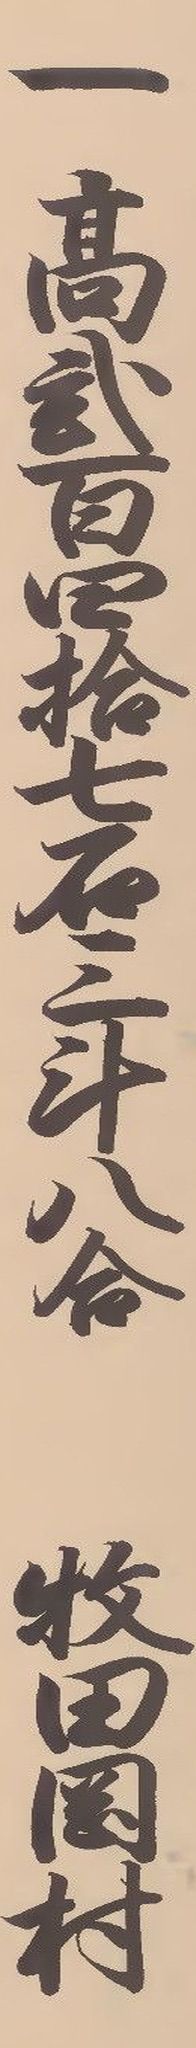一高弐百四拾七石三斗八合牧田岡村
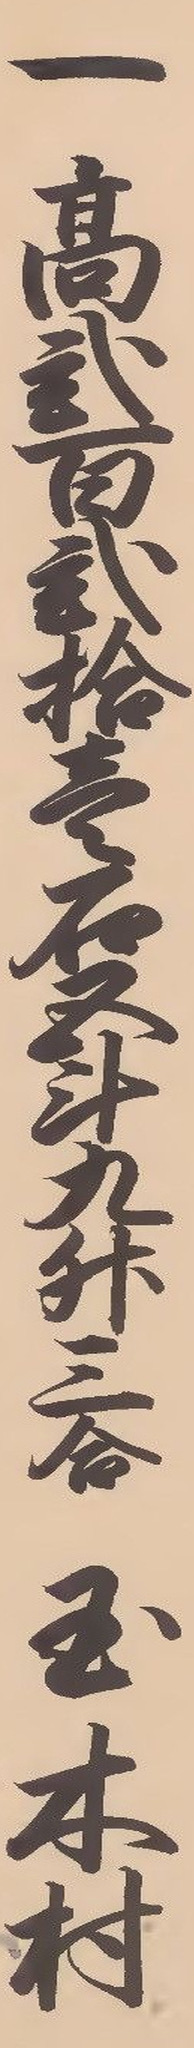一高弐百弐拾壱石五斗九升三合玉木村
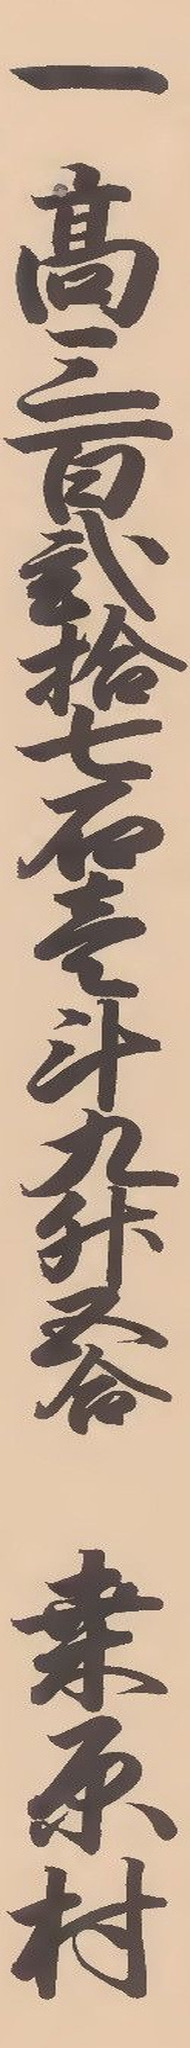一高三百弐拾七石壱斗九升五合桒原村
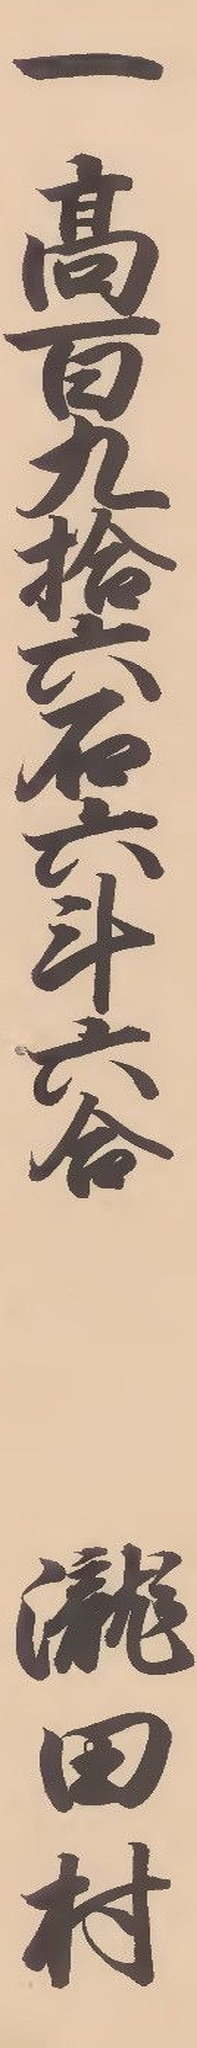一高百九拾六石六斗六合瀧田村

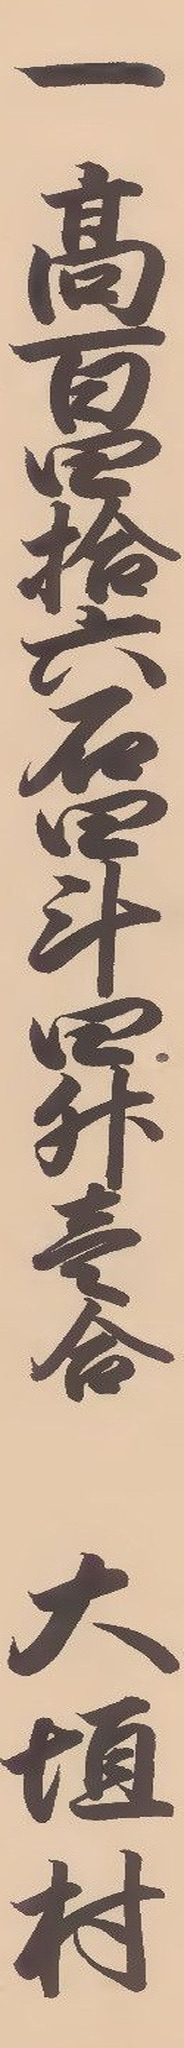一高百四拾六石四斗四升壱合大垣村
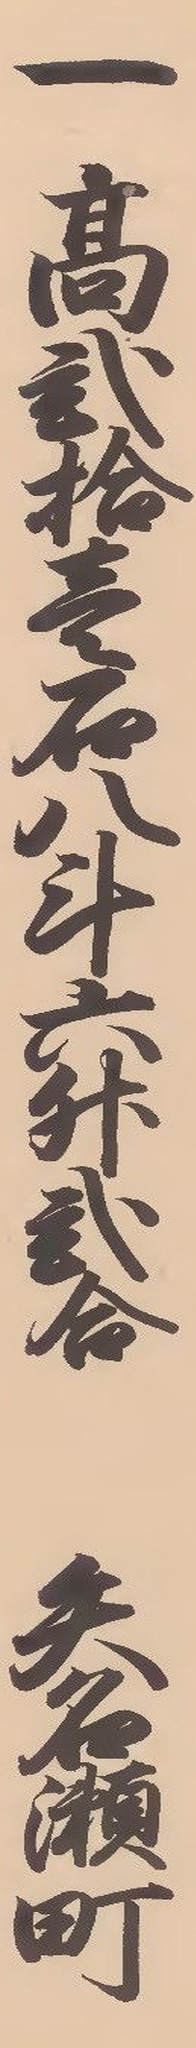一高弐拾壱石八斗六升弐合矢名瀬町
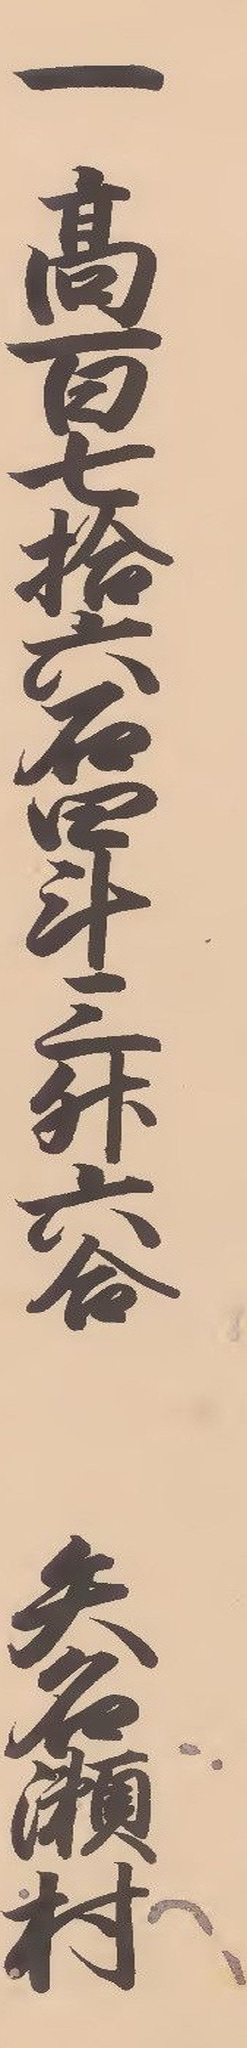一高百七拾六石四斗三升六合矢名瀬村
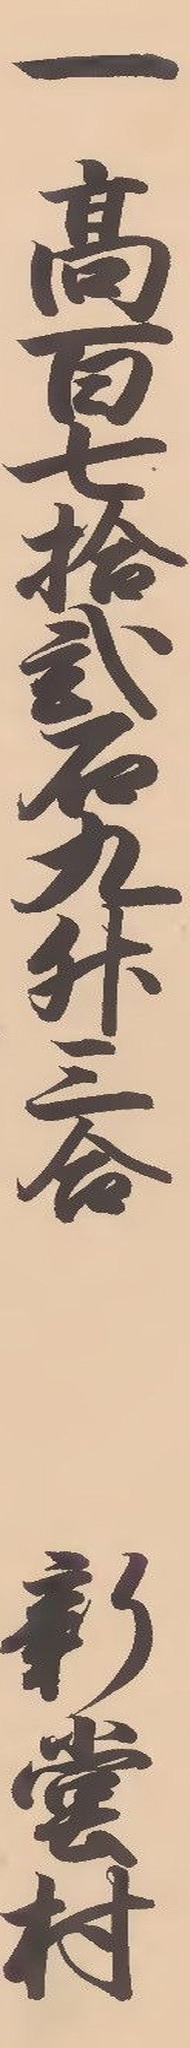一高百七拾弐石九升三合新堂村
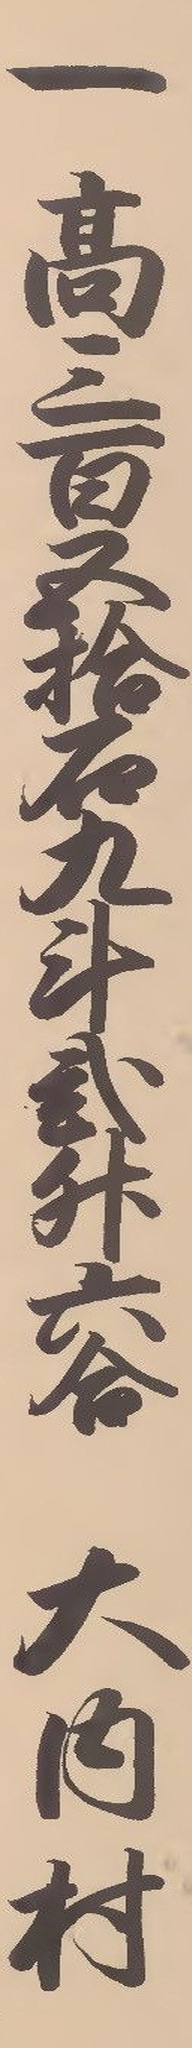一高三百五拾石九斗弐升六合大内村
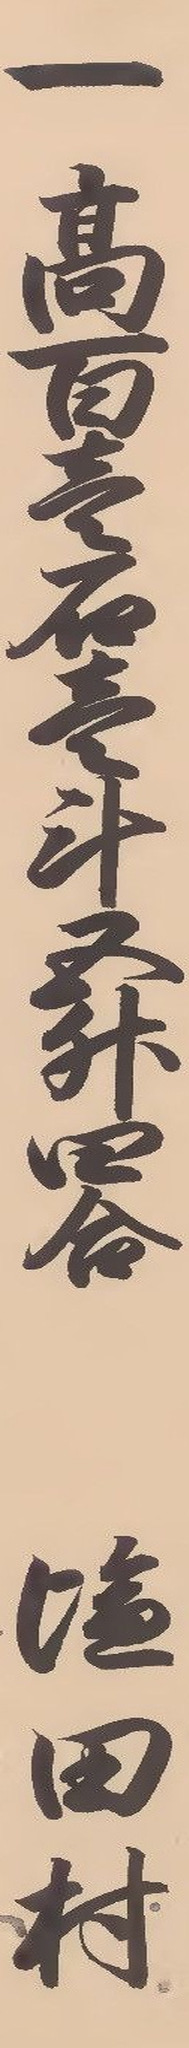一高百壱石壱斗五升四合塩田村
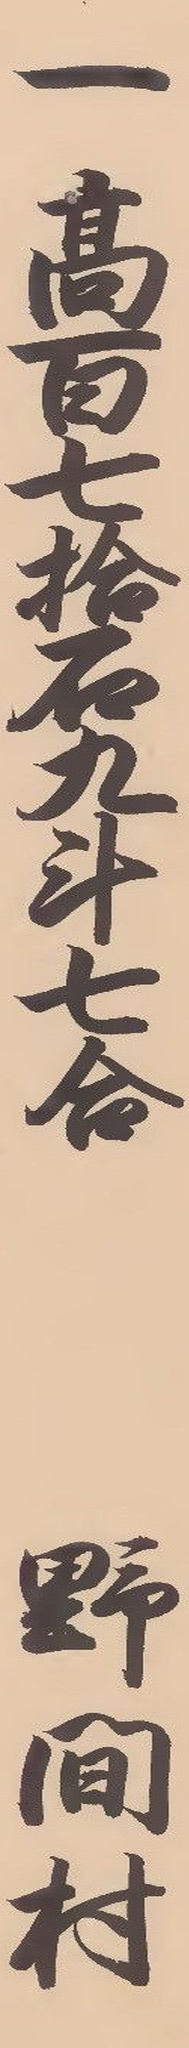一高百七拾石九斗七合野間村
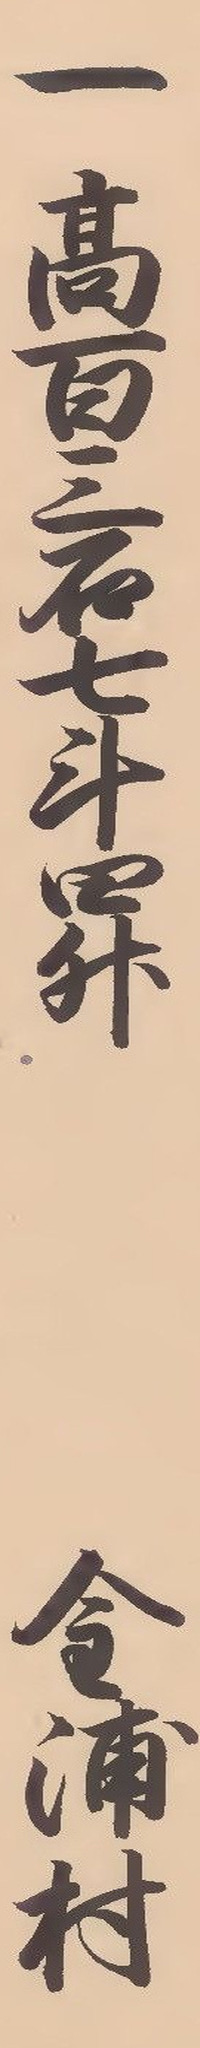一高百三石七斗四升金浦村

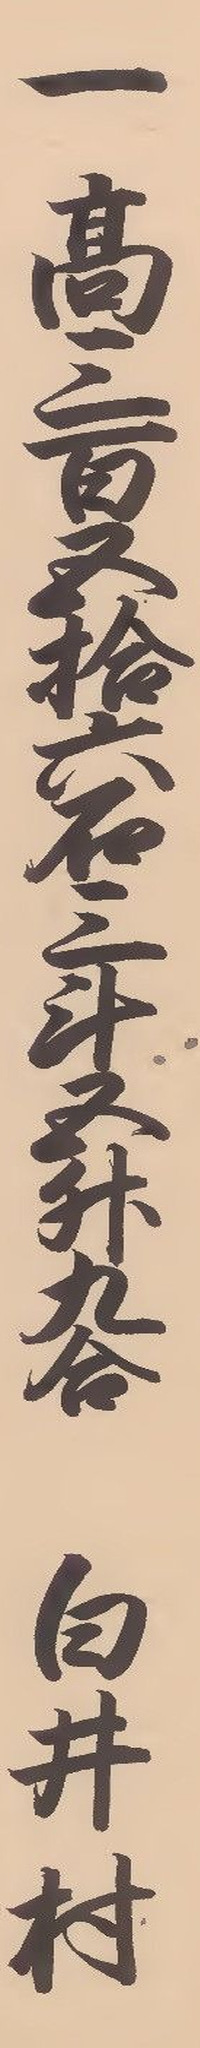一高三百五拾六石三斗五升九合白井村
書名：但馬国郷帳
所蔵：国立公文書館 National Archives of Japan
